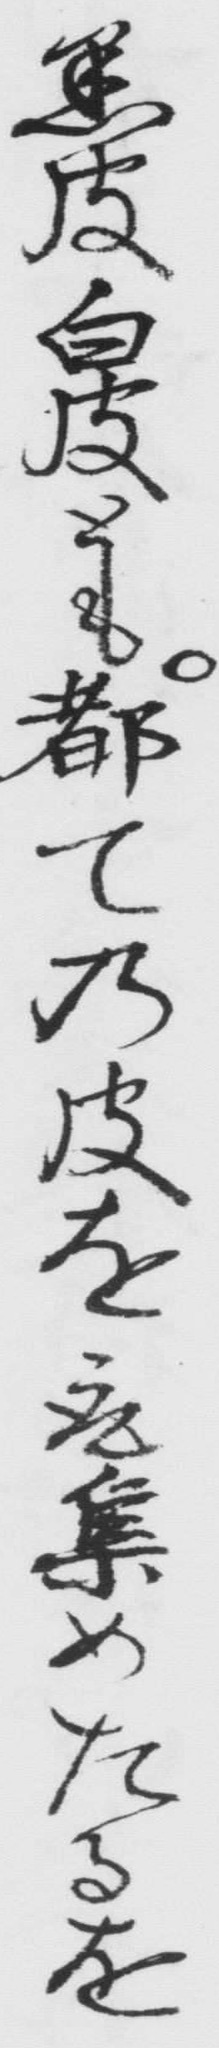皮身黒皮白皮とも。都ての皮を取集めたるを
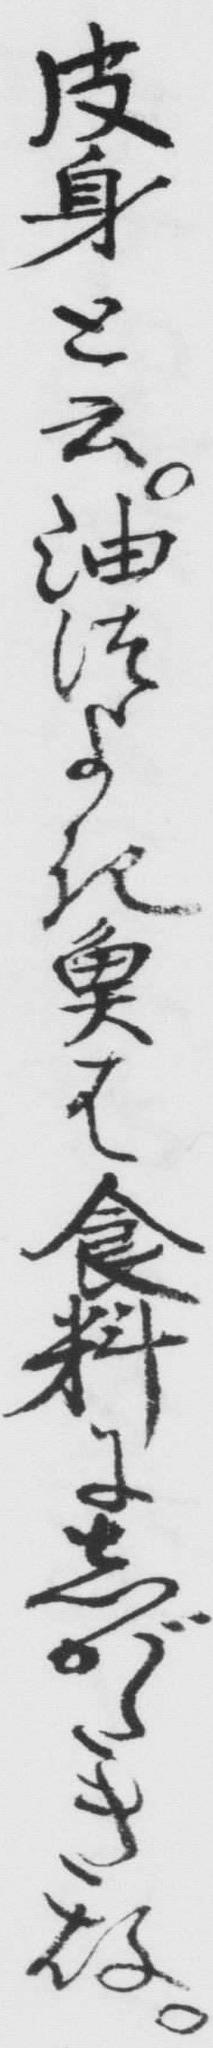皮身と云。油つよき魚は食料にしがたき故。
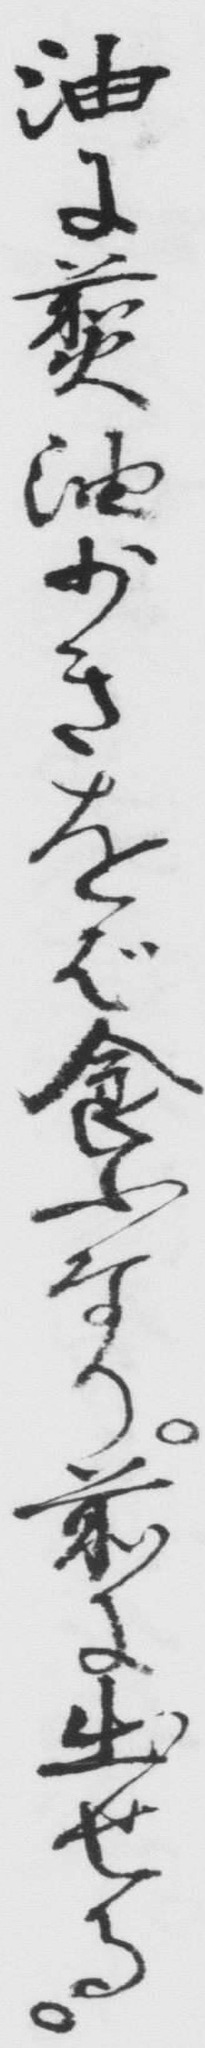油に煎油少きをば食ふなり。前に出せる
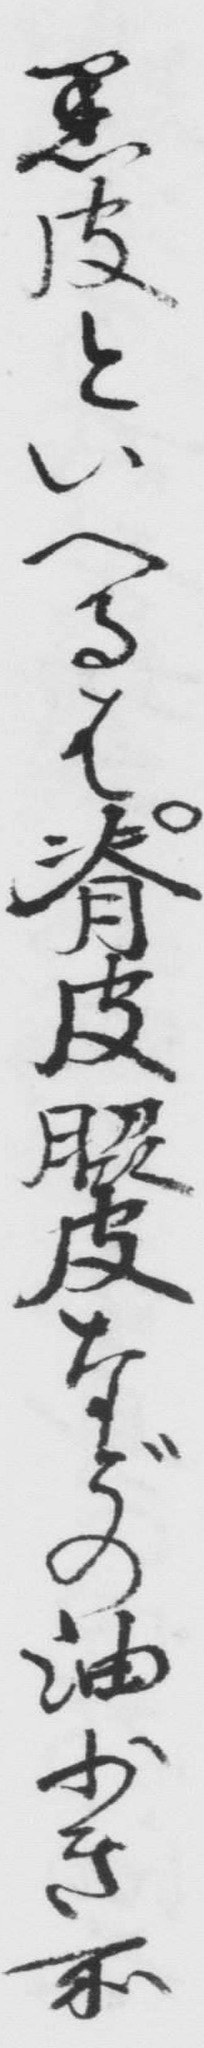黒皮といへるは。背皮脇皮など油少き所
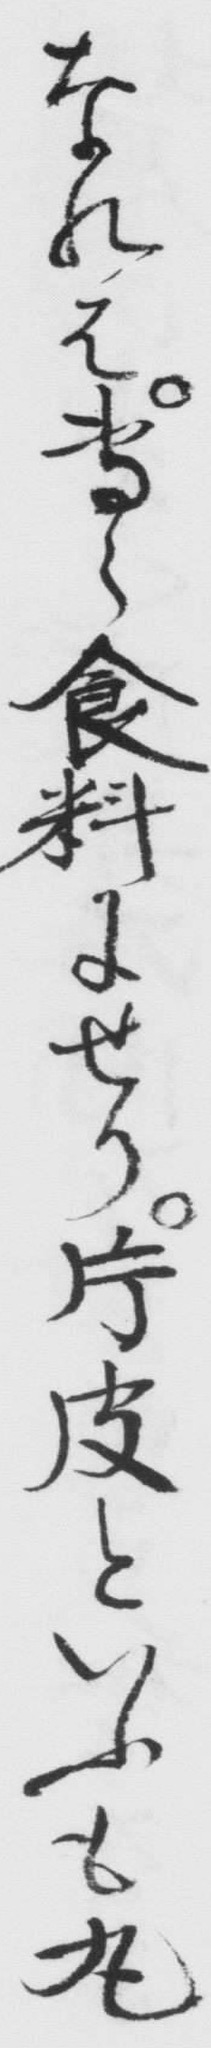なれは。専ら食料にせり。片皮といふも丸
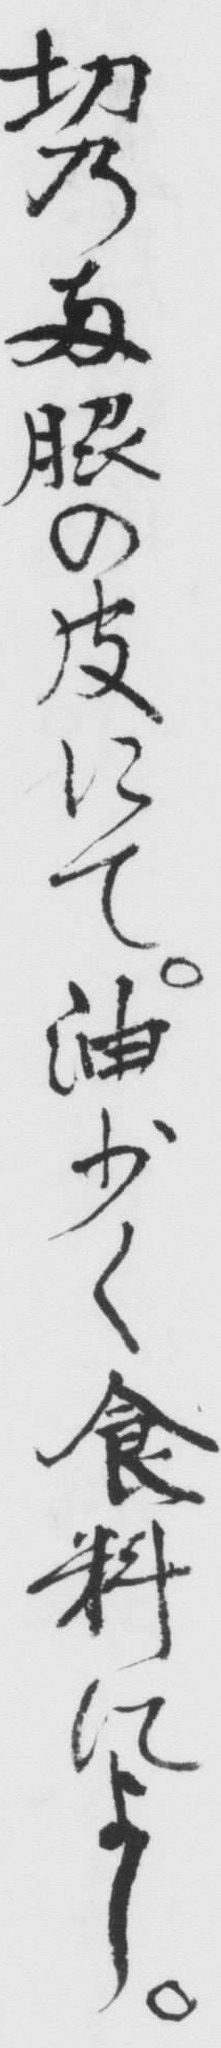切の両脇の皮にて。油少く食料によし。

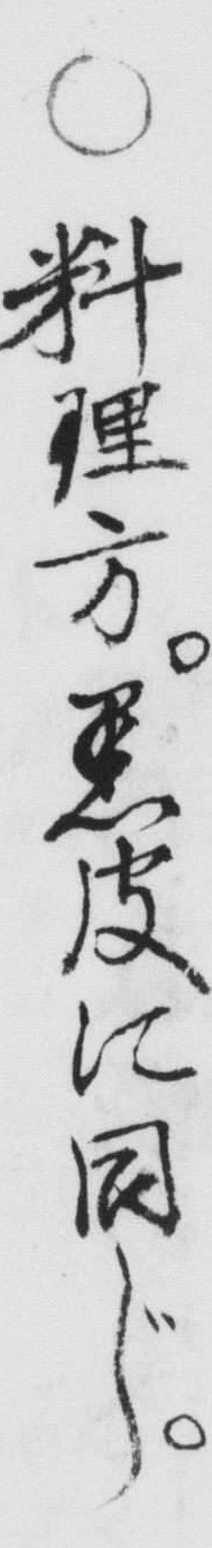○料理法。黒皮に同じ。
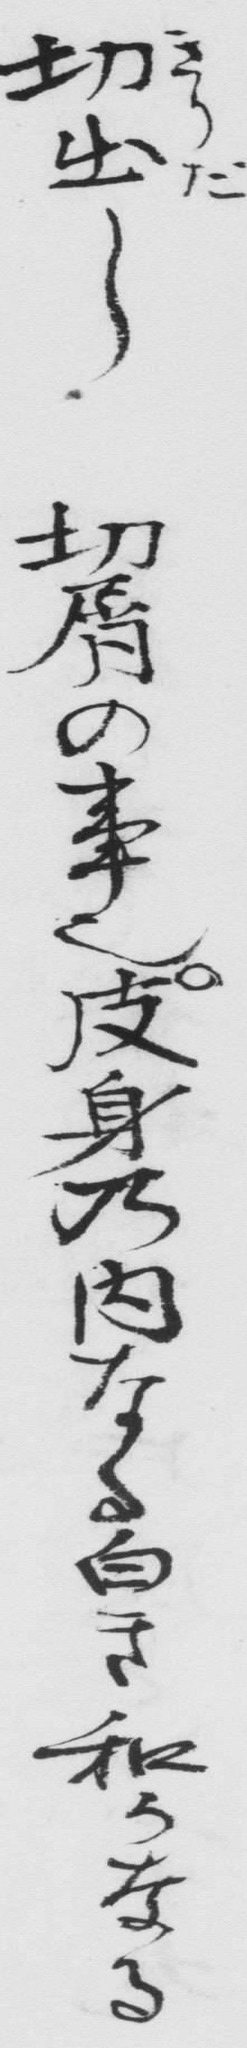切出し切屑の事也。皮身の内なる白き和かなる
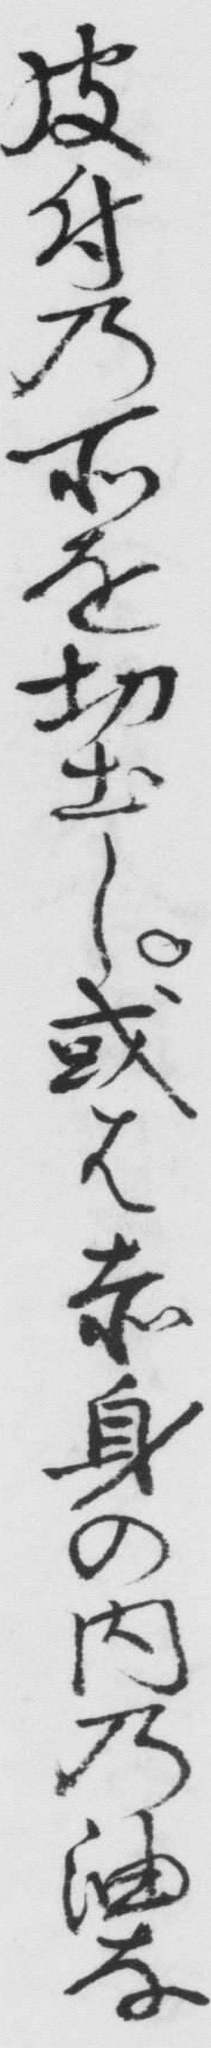皮付の所を切出し。或は赤身の内の油な
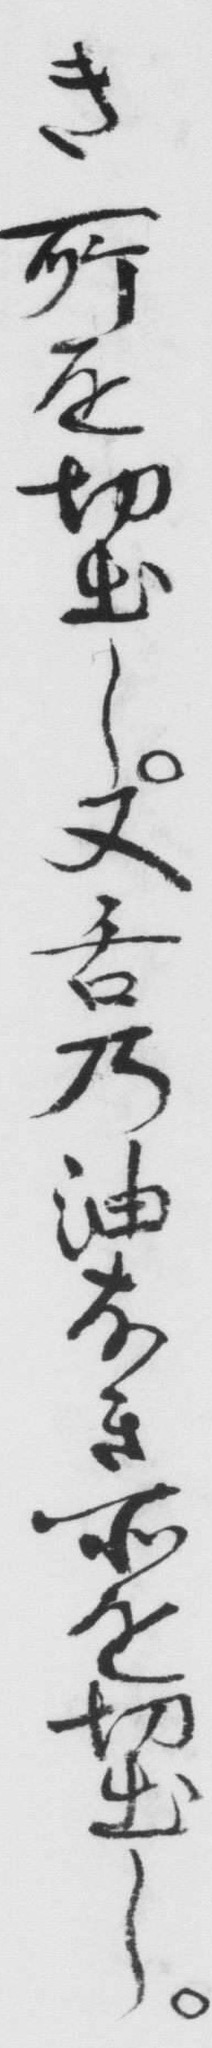き所を切出し。又舌の油なき所を切出し。
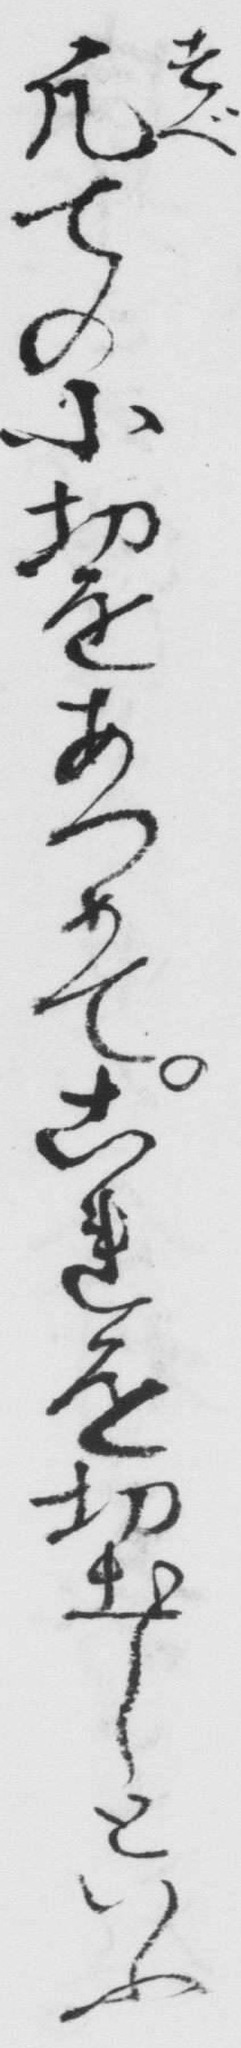凡ての小切をあつめて。これを切出しといふ
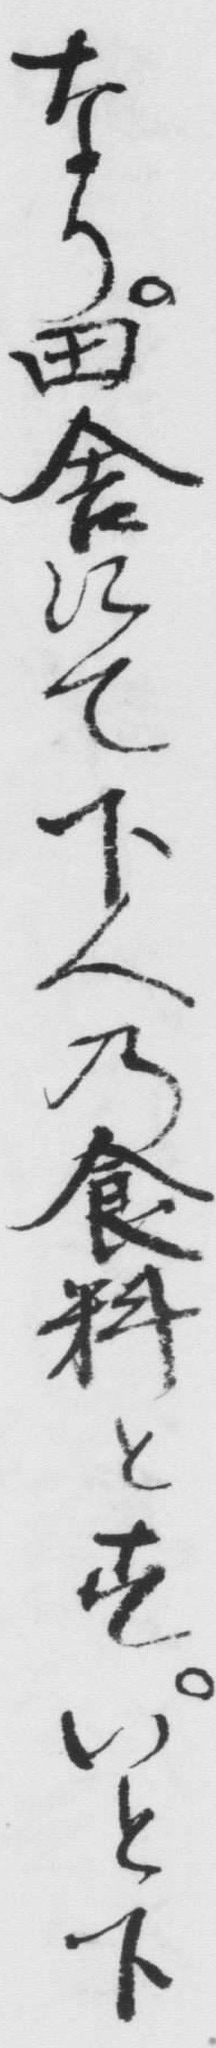なり。田舎にて下人の食料とす。いと下
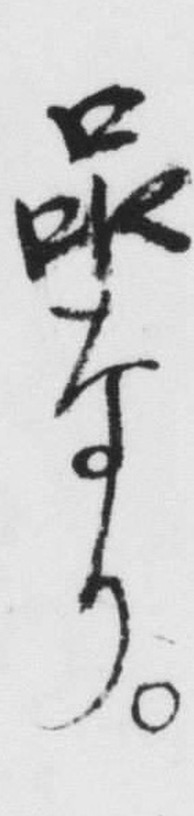品なり。
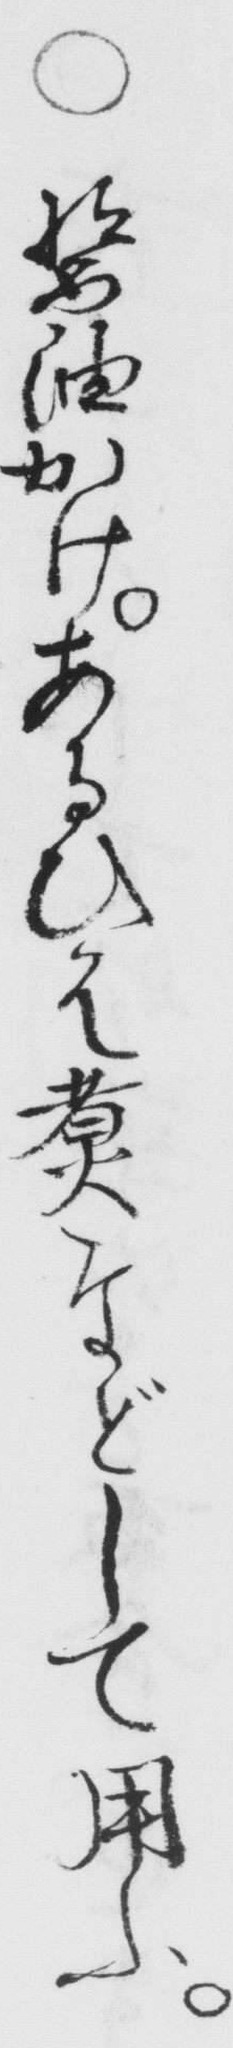○醤油かけ。あるひは煮などして用ふ。
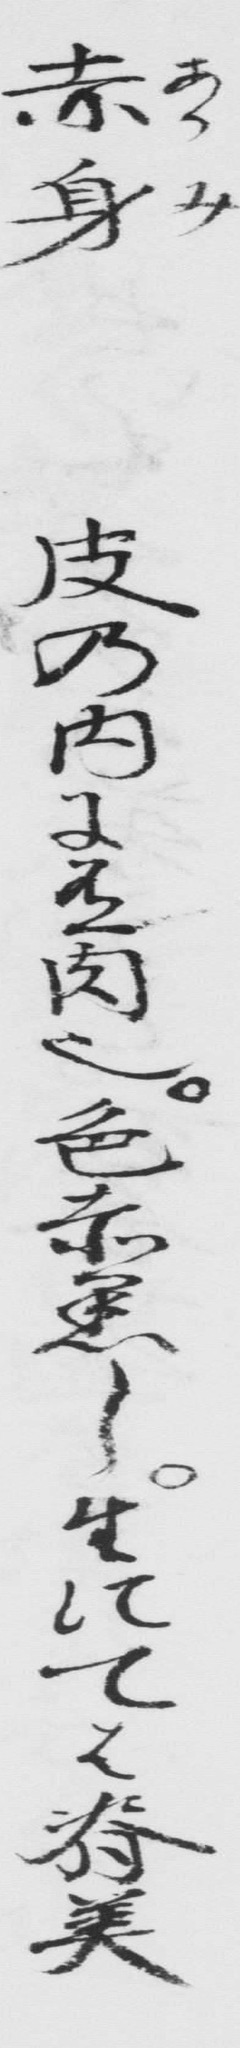赤身皮の内に有肉也。色赤黒し。生にては背美
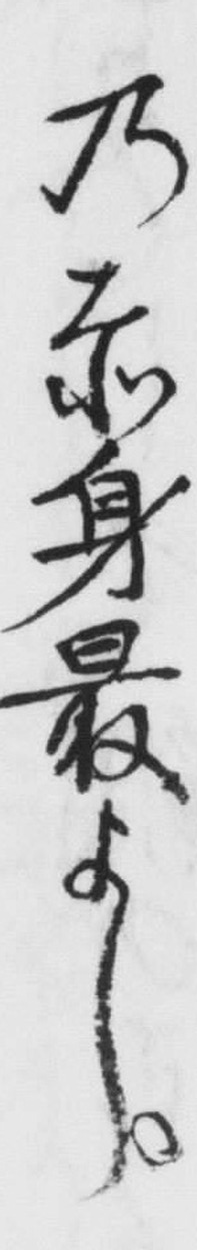の赤身最よし。
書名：鯨肉調味方
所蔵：大阪府立大学学術情報センター 国文学研究資料館
